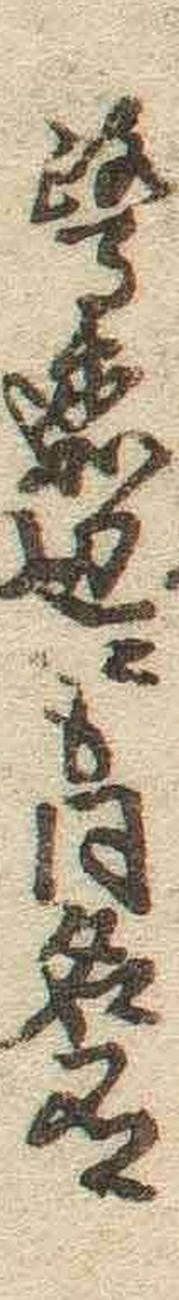鷺森辺にも同名有
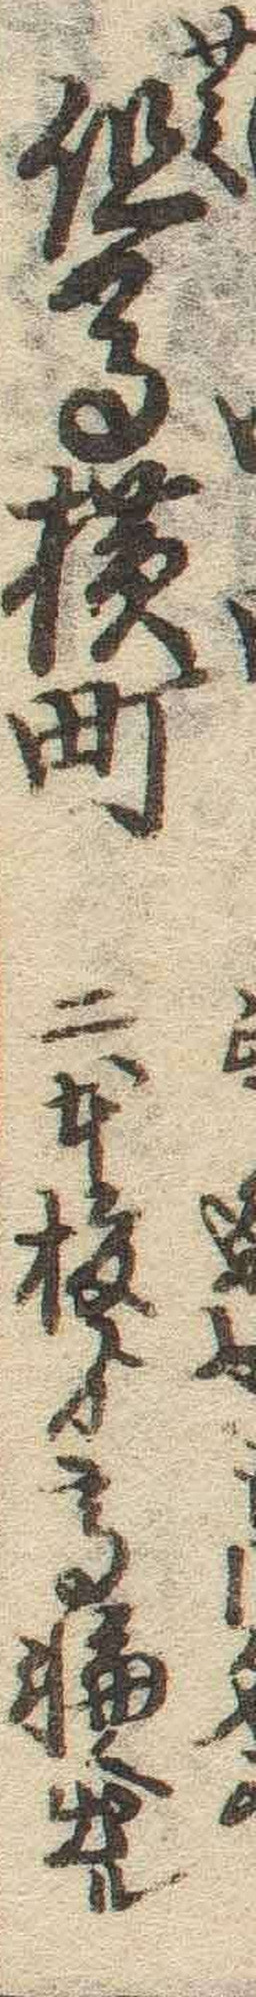但馬横町二本榎ゟ高輪へ出ル

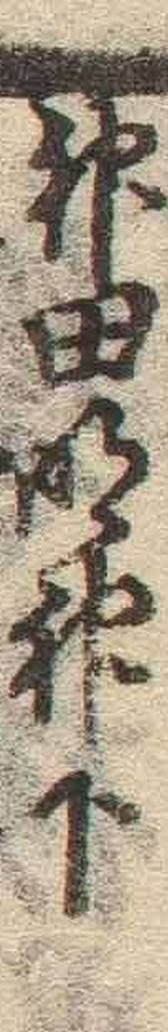神田明神下
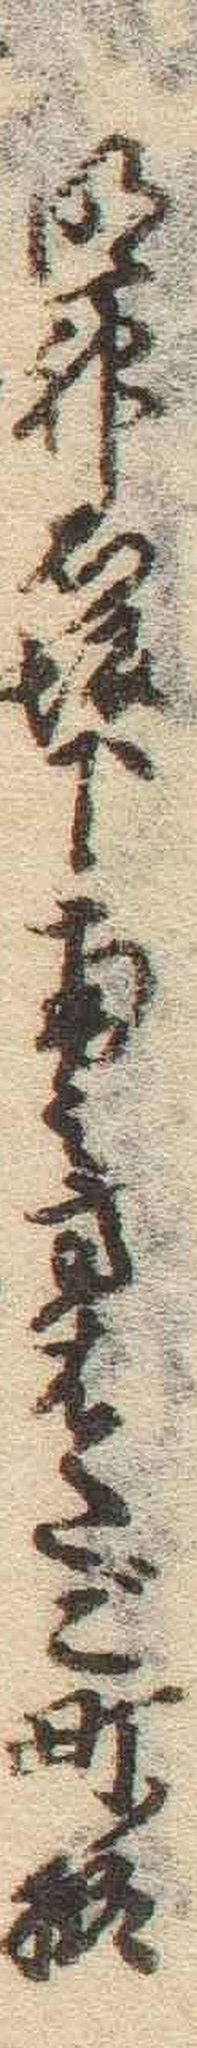明神石坂下南之方はたご町ノ脇
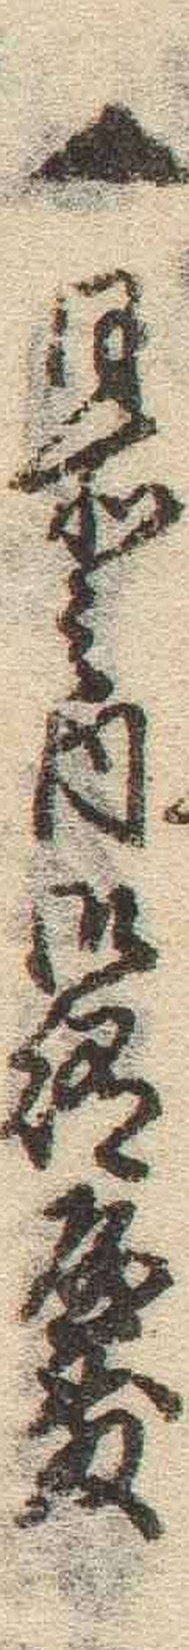▲同所之内御賄屋敷
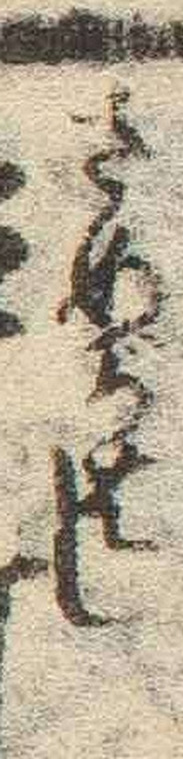さめがはし
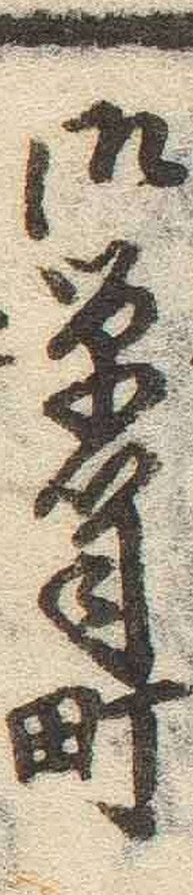御単笥町
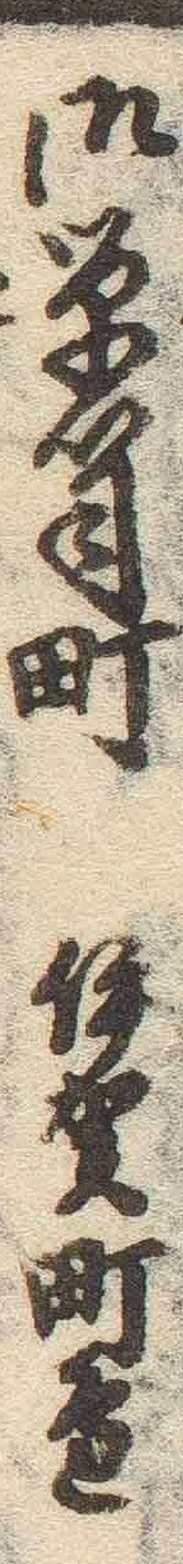御単笥町伊賀町辺
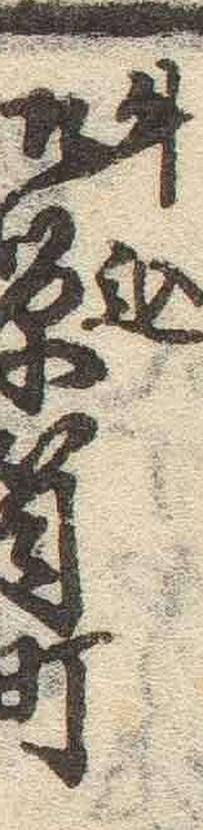御単笥町
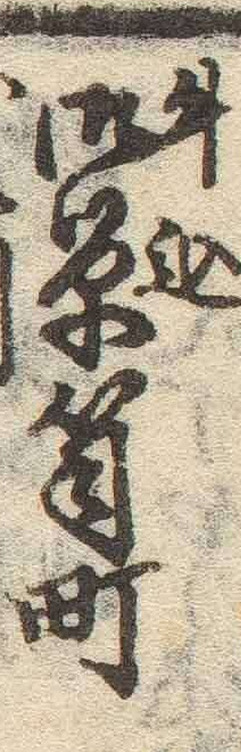御単笥町
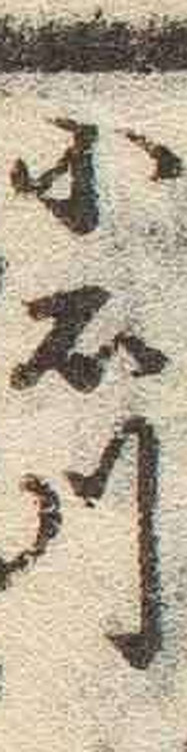小石川
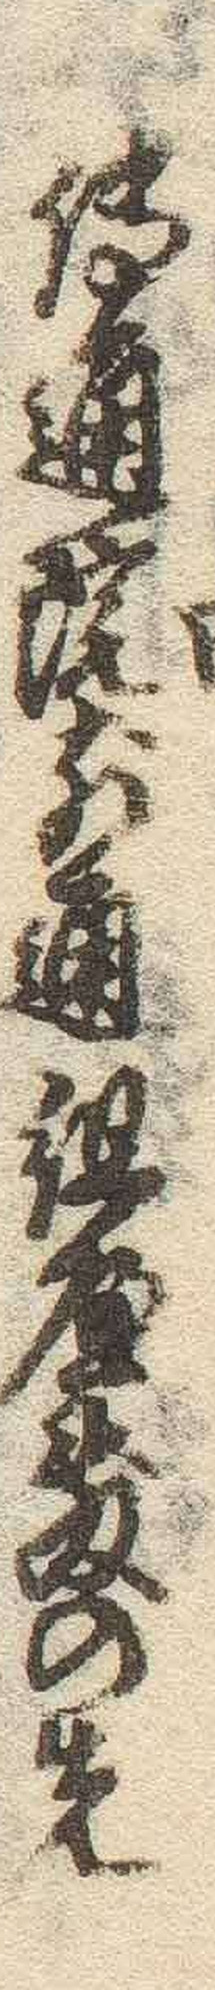伝通院前通組屋敷の先
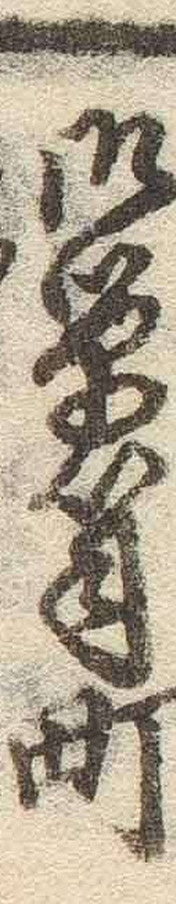御単笥町
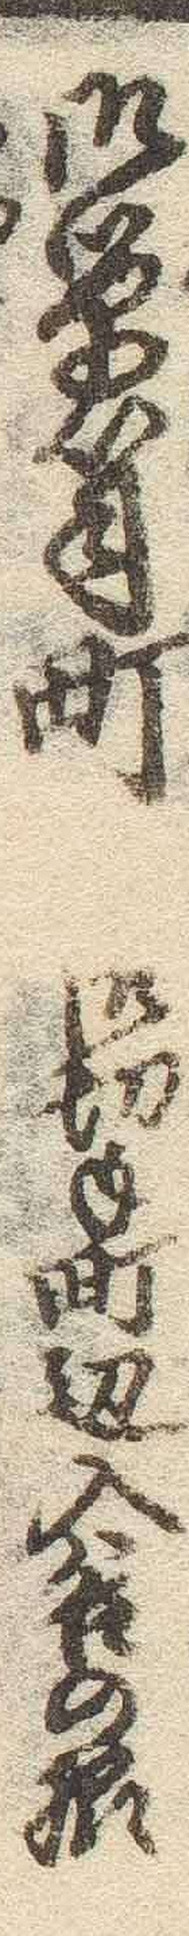御単笥町御切手町辺入谷の脇
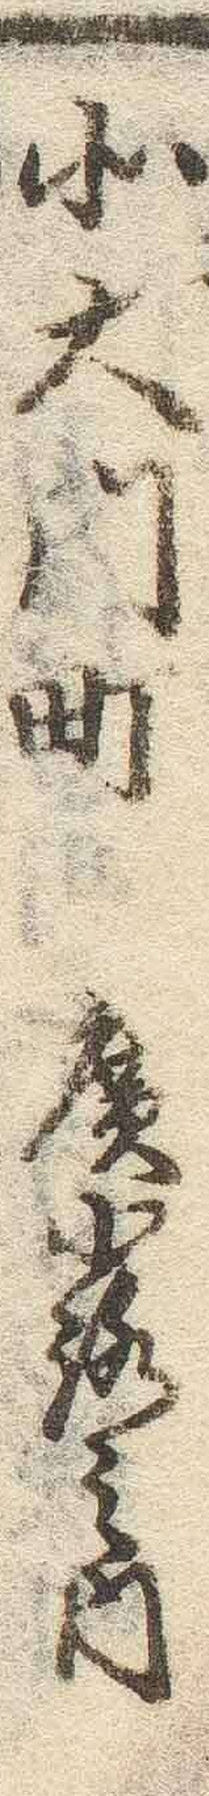北大門町広小路之内
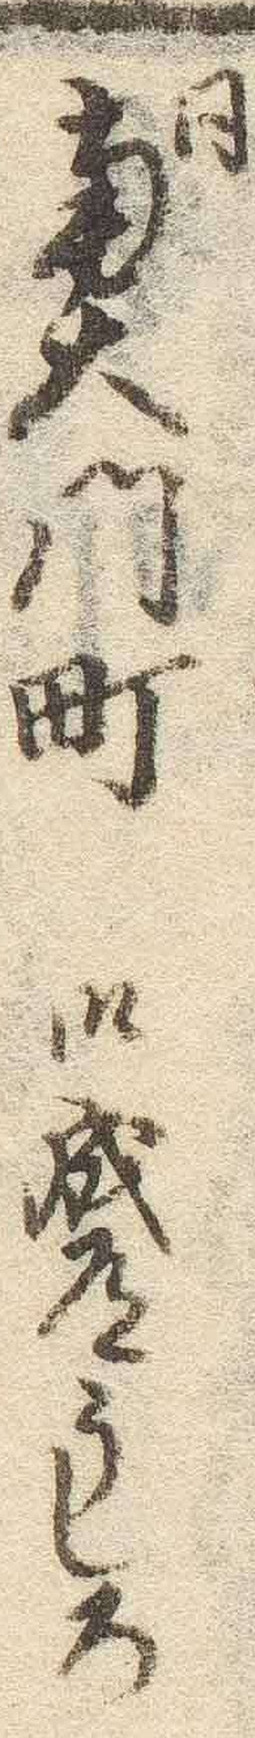南大門町御成道うしろ
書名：江戸町独案内
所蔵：東京学芸大学附属図書館 国文学研究資料館
